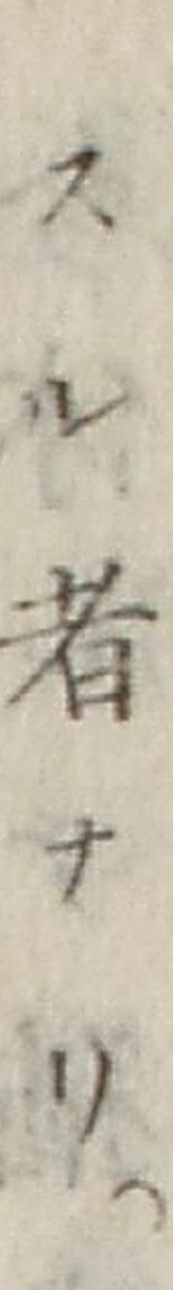スル者ナリ。
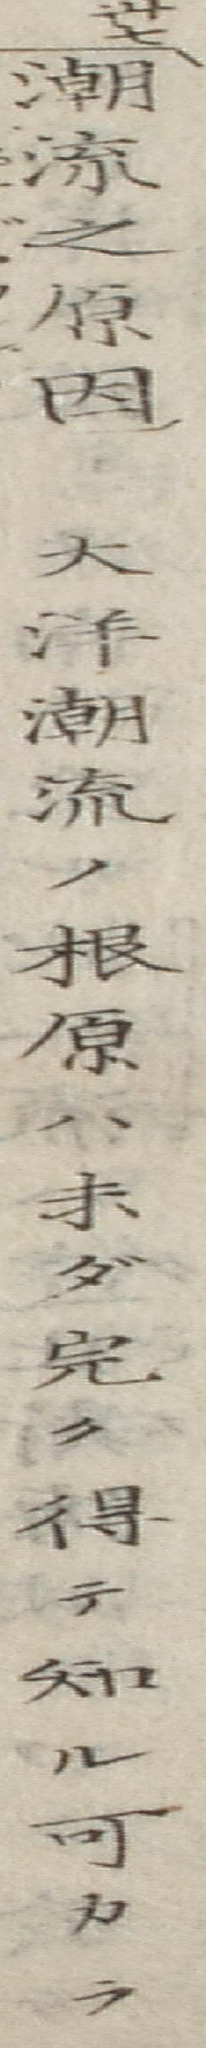卅七〔潮流之原因〕大洋潮流ノ根原ハ未ダ完ク得テ知ル可カラ
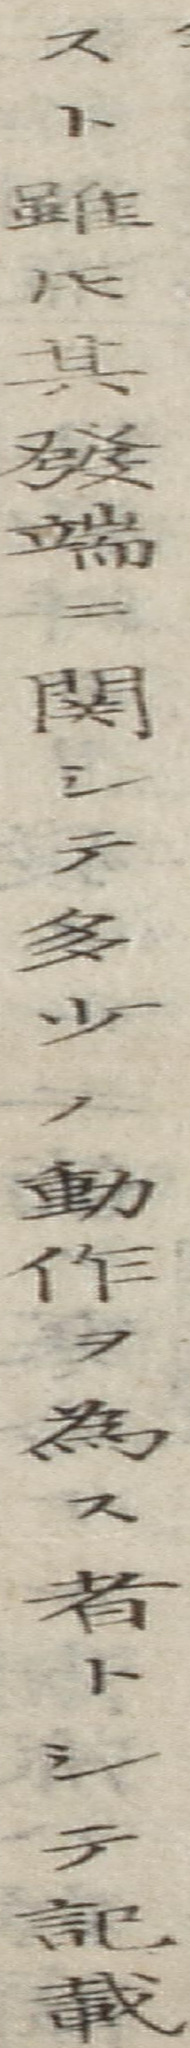スト雖トモ其発端ニ関シテ多少ノ動作ヲ為ス者トシテ記載
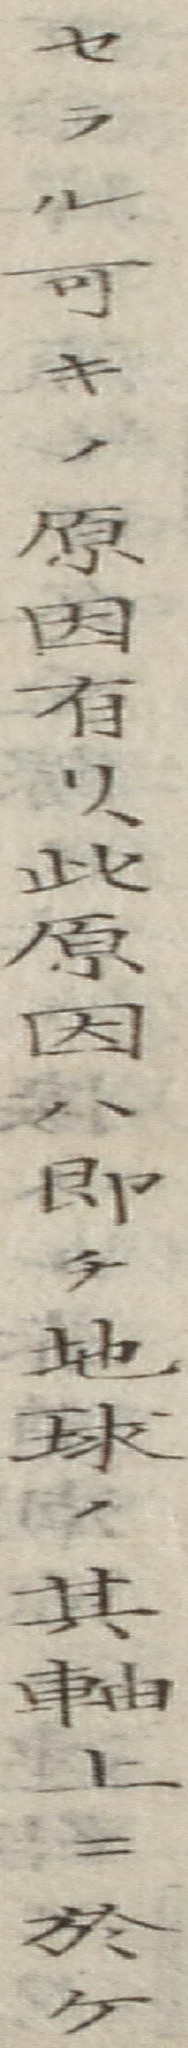セラル可キノ原因有リ、此原因ハ即チ地球ノ其軸上ニ於ケ
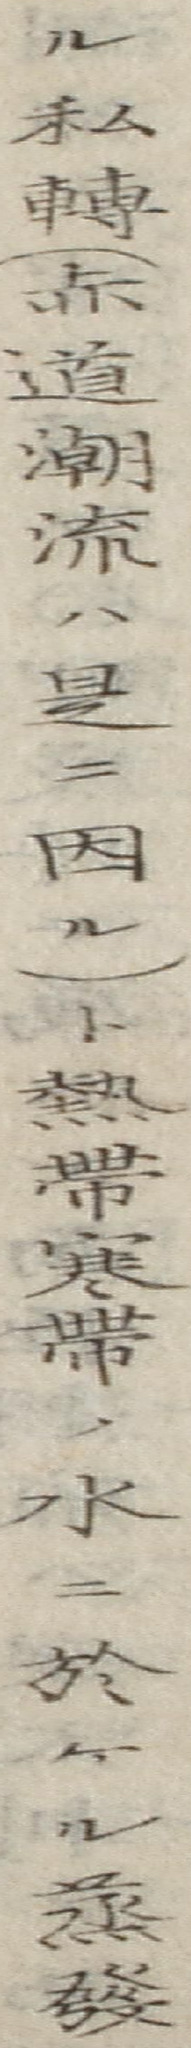ル私転ト熱帯寒帯ノ水ニ於ケル蒸発
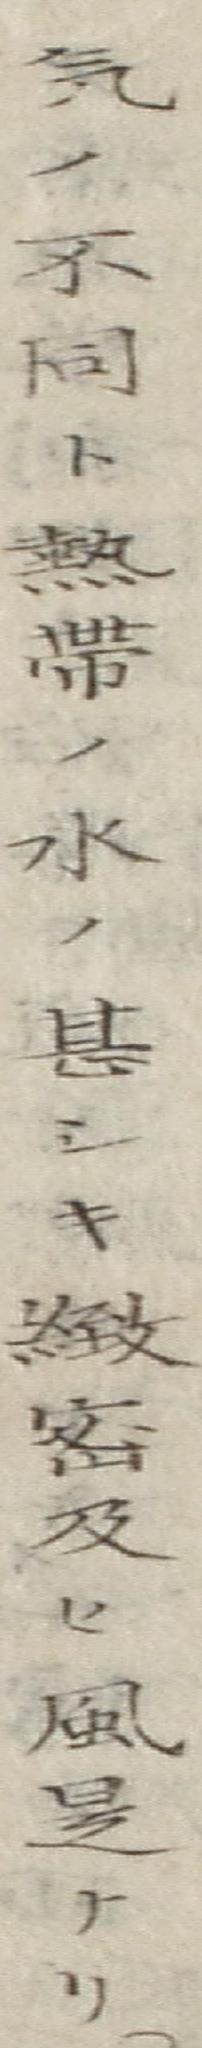気ノ不同ト熱帯ノ水ノ甚シキ緻密及ヒ風是ナリ。
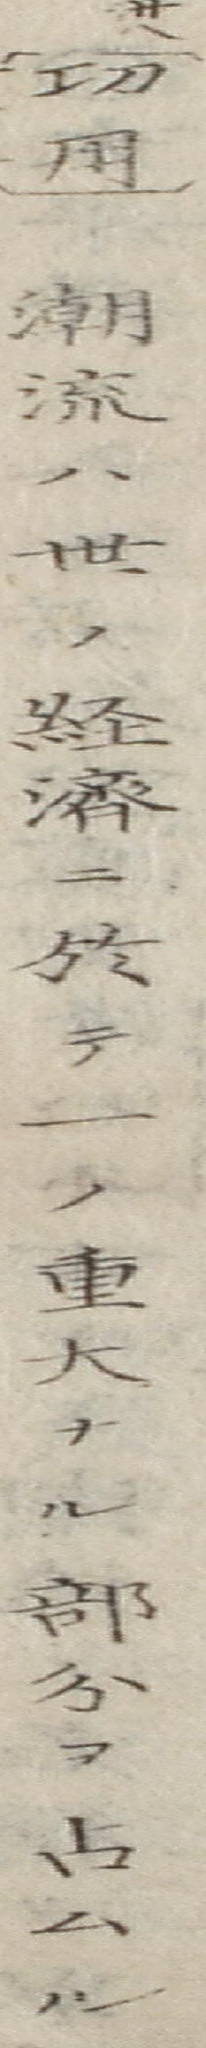卅八〔功用〕潮流ハ世ノ経済ニ於テ一ノ重大ナル部分ヲ占ムル
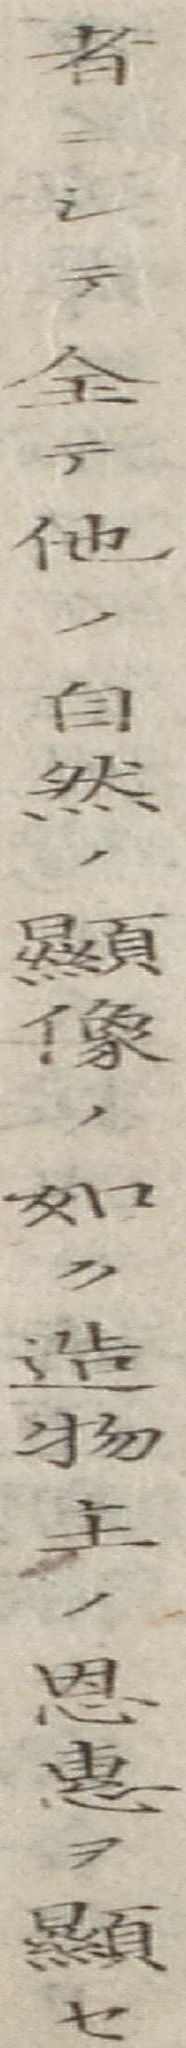者ニシテ全テ他ノ自然ノ顕像ノ如ク造物主ノ恩恵ヲ顕セ
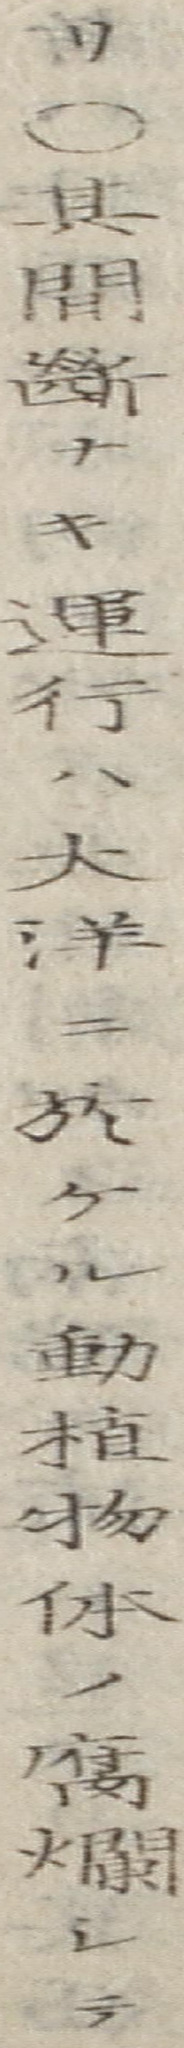リ○其間断ナキ運行ハ大洋ニ於ケル動植物体ノ腐爛シテ
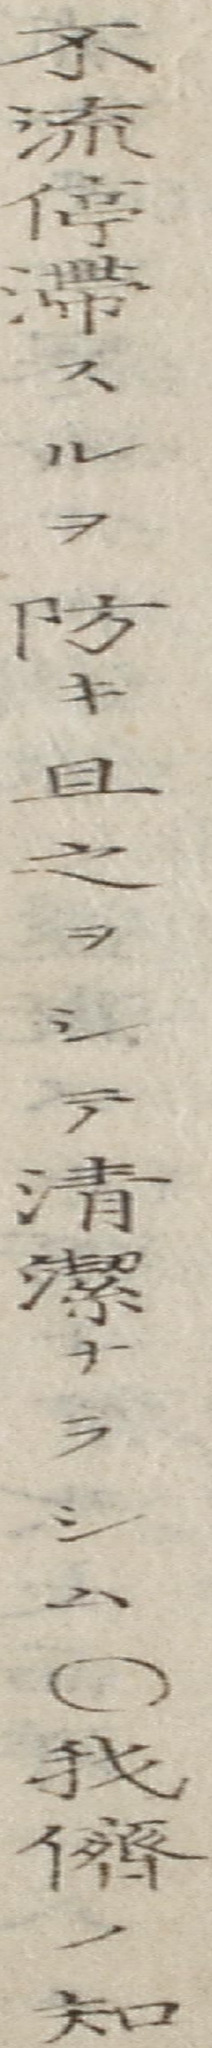不流停滞スルヲ防キ且之ヲシテ清潔ナラシム○我儕ノ知
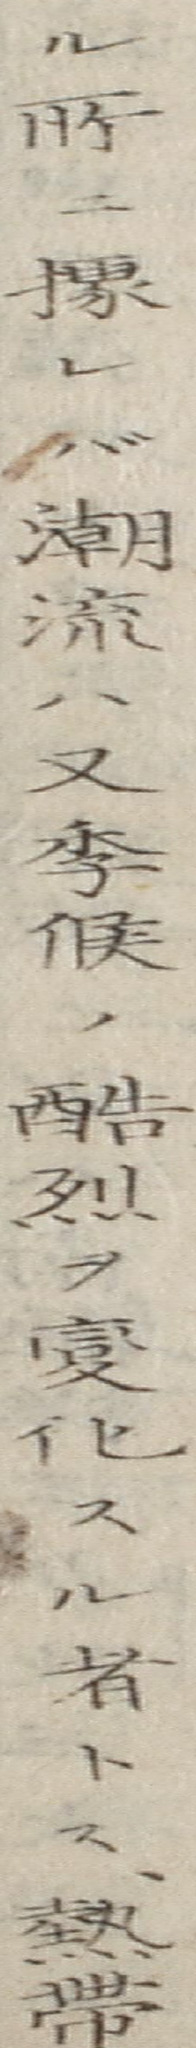ル所ニ據レバ潮流ハ又季候ノ酷烈ヲ変化スル者トス、熱帯
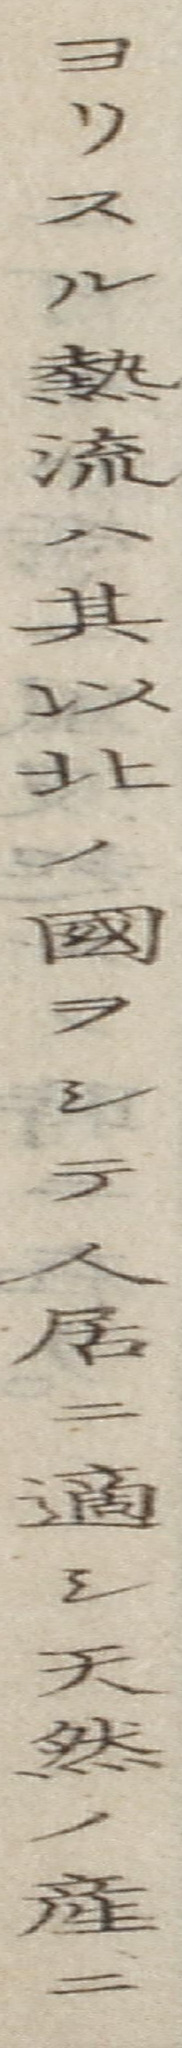ヨリスル熱流ハ其以北ノ国ヲシテ人居ニ適シ天然ノ産ニ
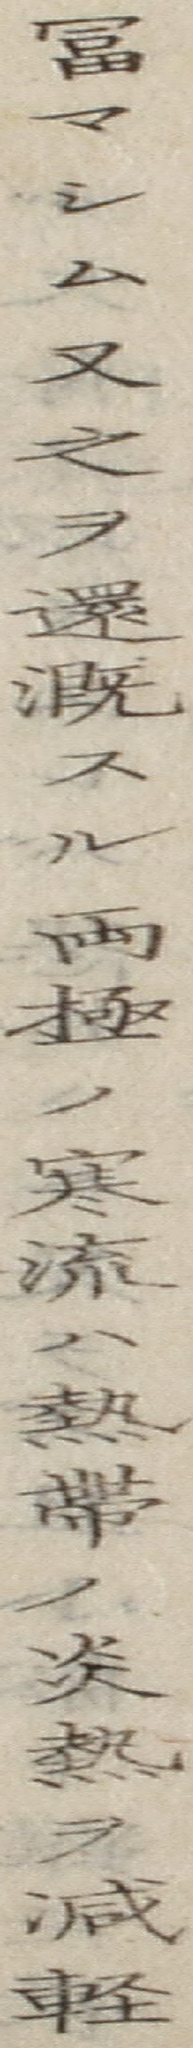富マシム又之ヲ還漑スル両極ノ寒流ハ熱帯ノ炎熱ヲ減軽
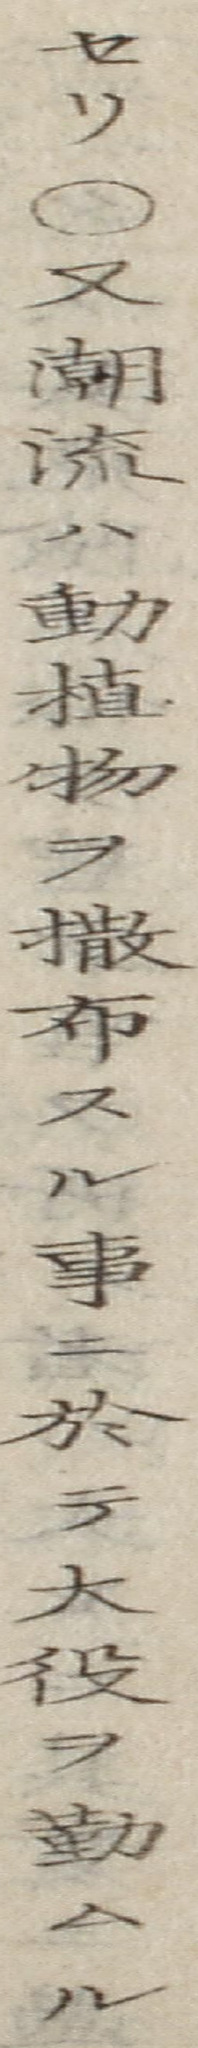セリ○又潮流ハ動植物ヲ撒布スル事ニ於テ大役ヲ勤ムル
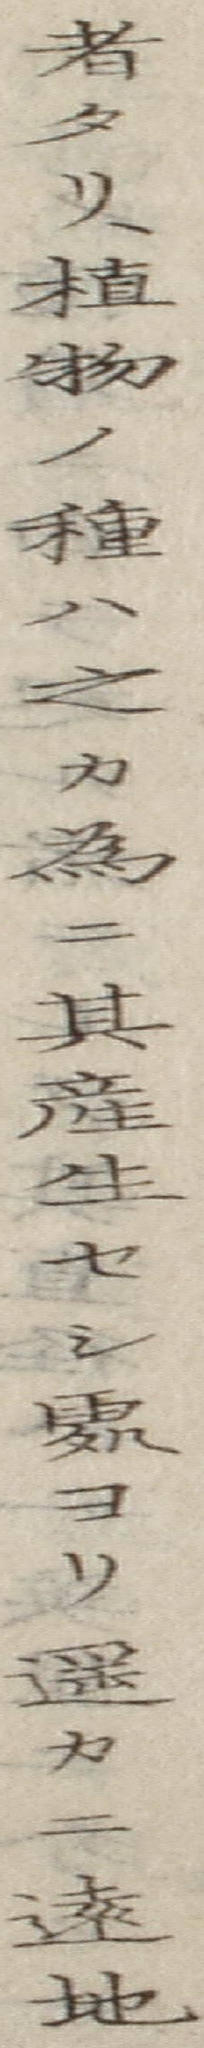者タリ、植物ノ種ハ之カ為ニ其産生セシ處ヨリ遥カニ遠地
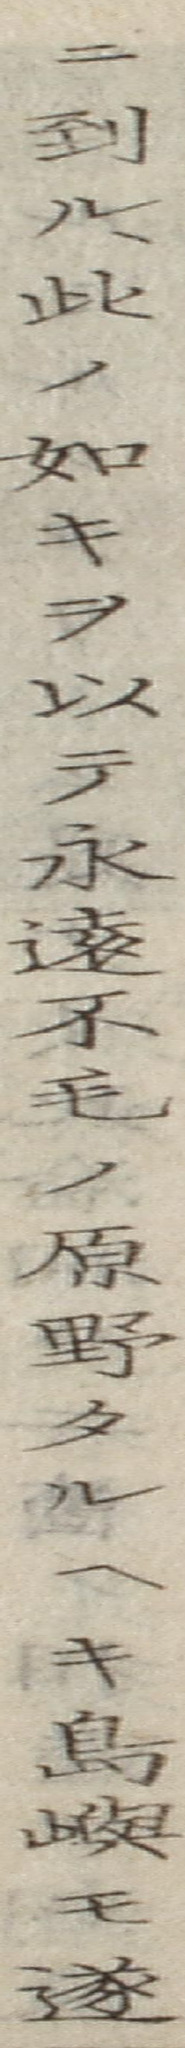ニ到ル、此ノ如キヲ以テ永遠不毛ノ原野タルヘキ島嶼モ遂
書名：地形論　巻二
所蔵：東京大学地震研究所図書室 Earthquake Research Institute Library, The University of Tokyo, JAPAN
